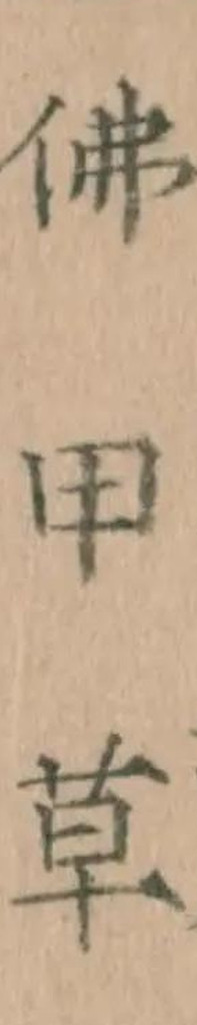仏甲草
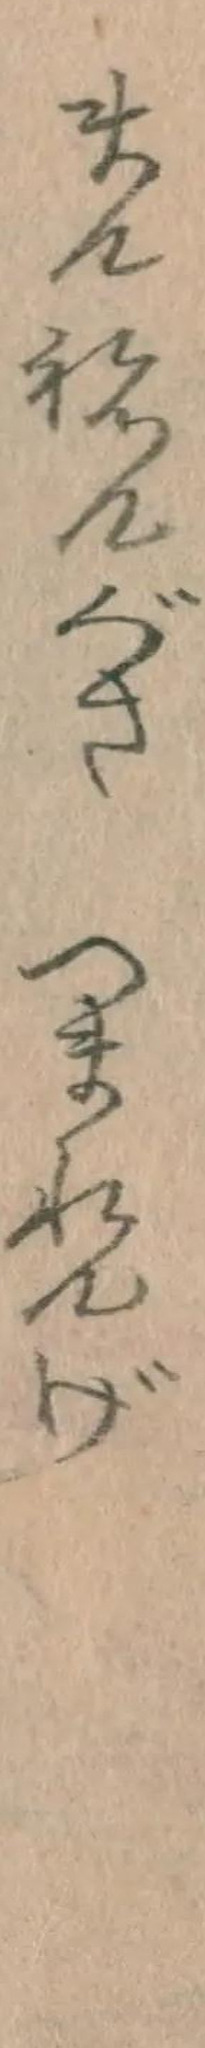まんねんぐさつまれんげ
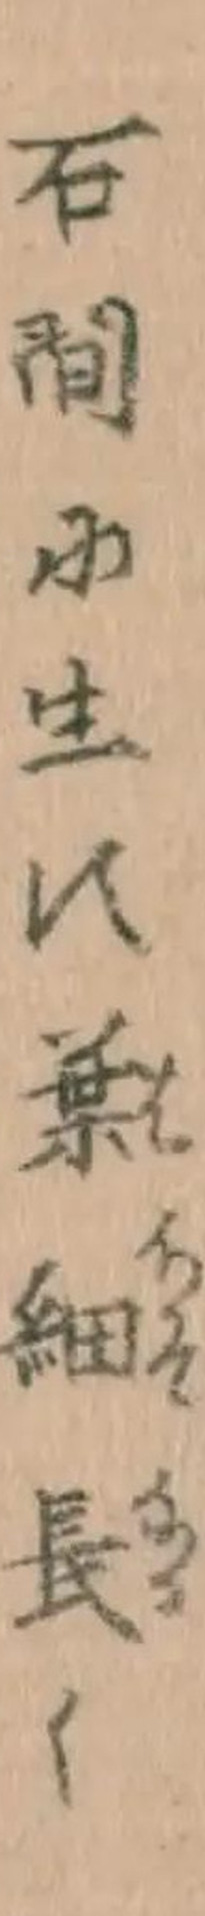石間に生す葉細長く
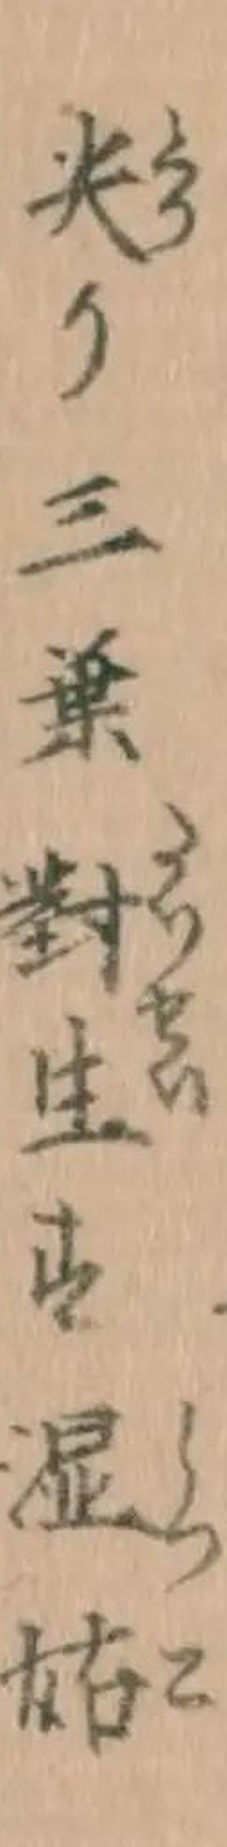尖り三葉対生す湿姑
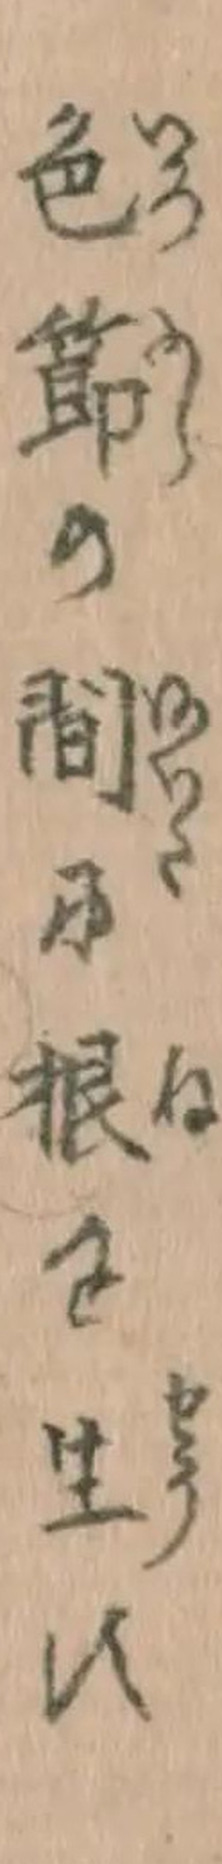色節の間に根を生す
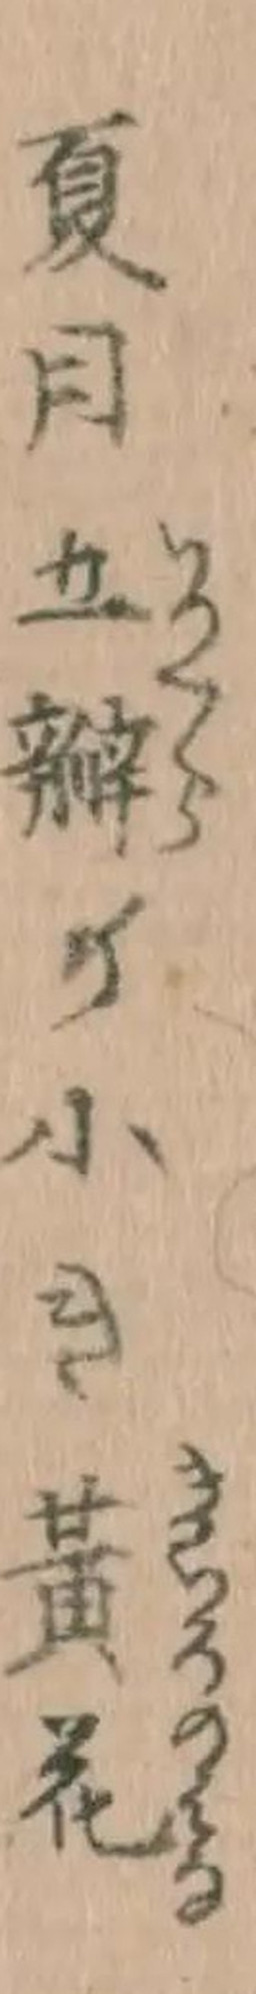夏月五弁の小き黄花
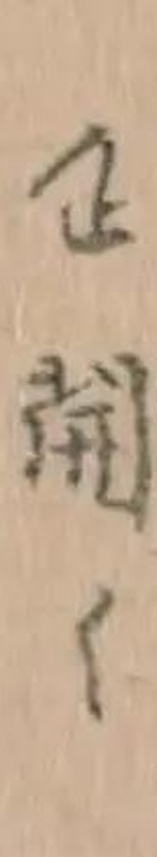を開く
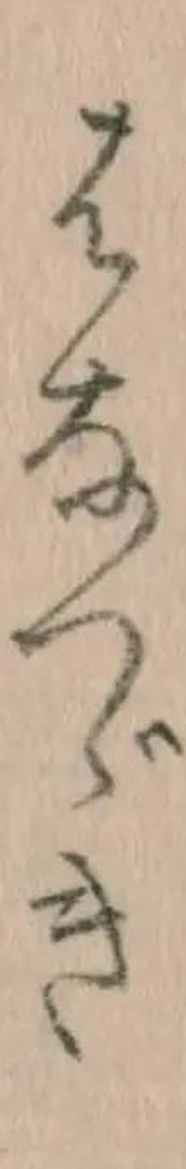はなつゞき
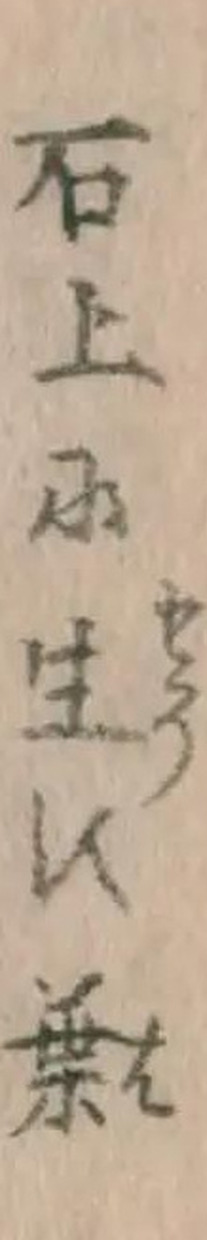石上に生す葉
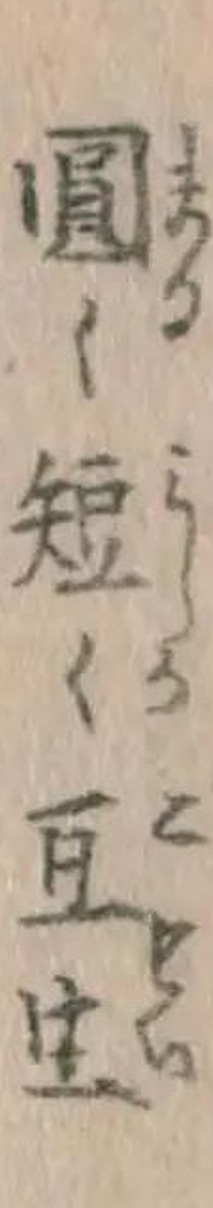円く短く互生
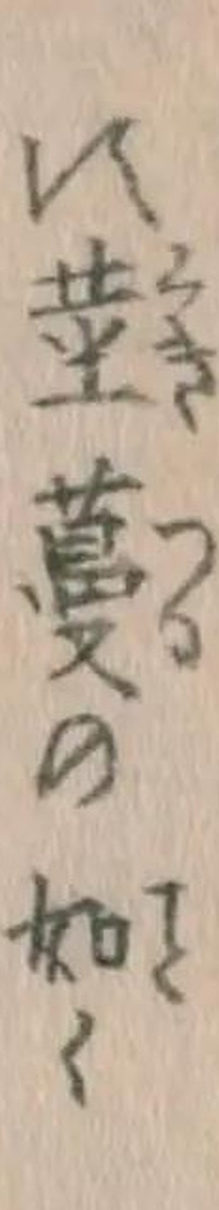す茎蔓の如く
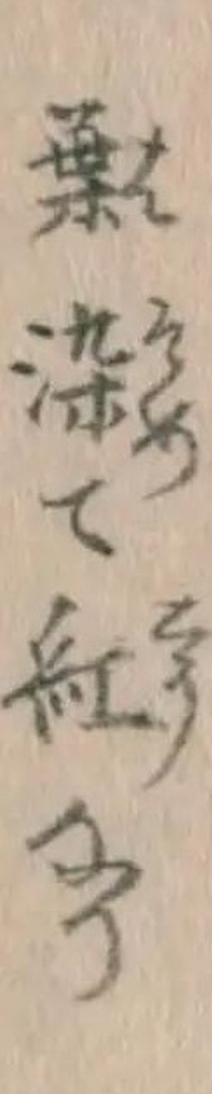葉染て紅なり

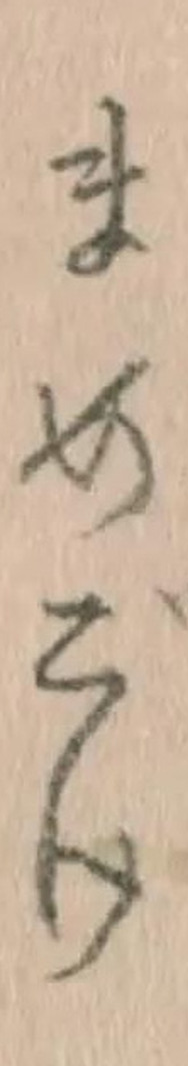まめごけ
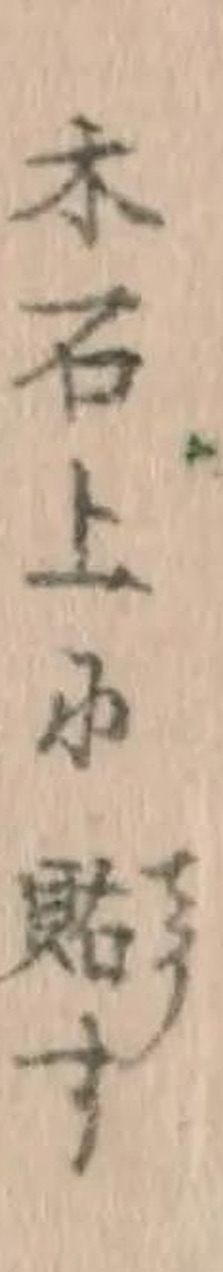木石上に貼す
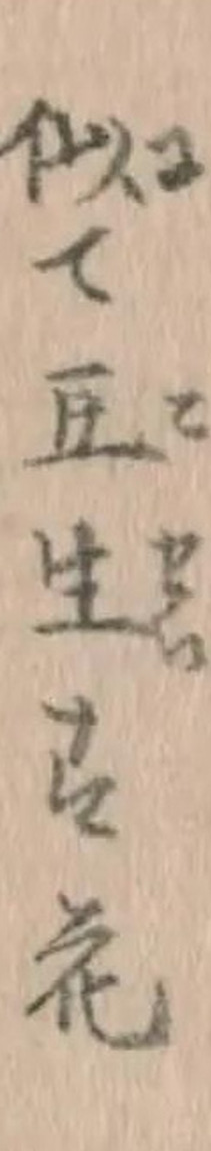似て互生す花
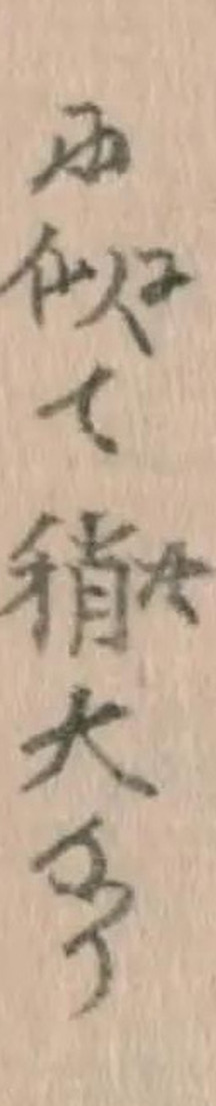に似て稍大なり
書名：本草図譜. 巻34-36
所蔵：国立国会図書館 National Diet Library, JAPAN
